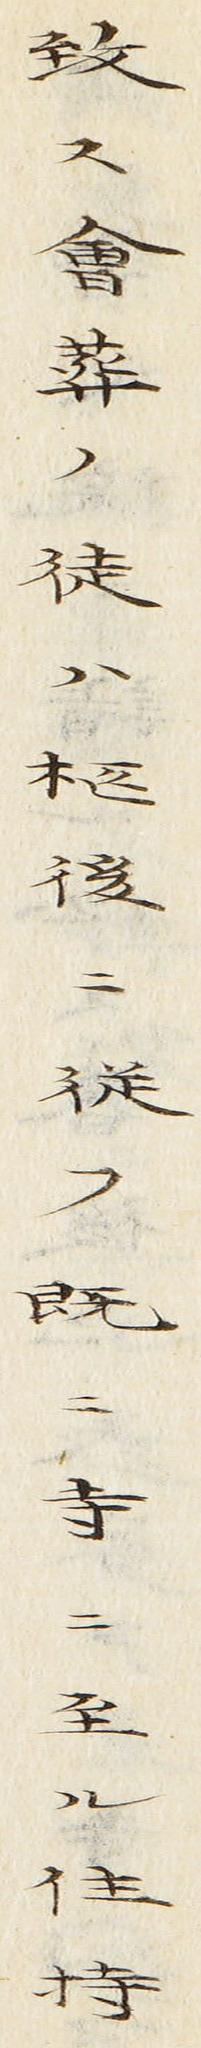致ス会葬ノ徒ハ柩後ニ従フ既ニ寺ニ至ル住持
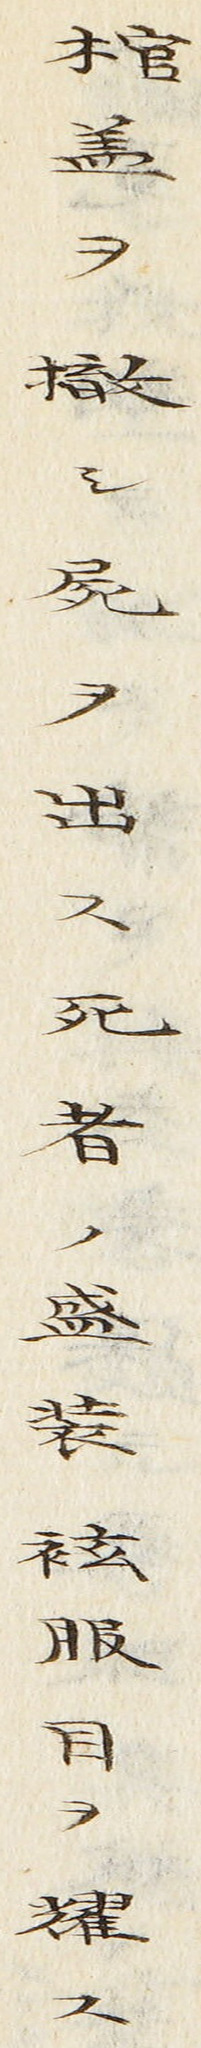棺蓋ヲ撒シ屍ヲ出ス死者ノ盛装袨服目ヲ耀ス
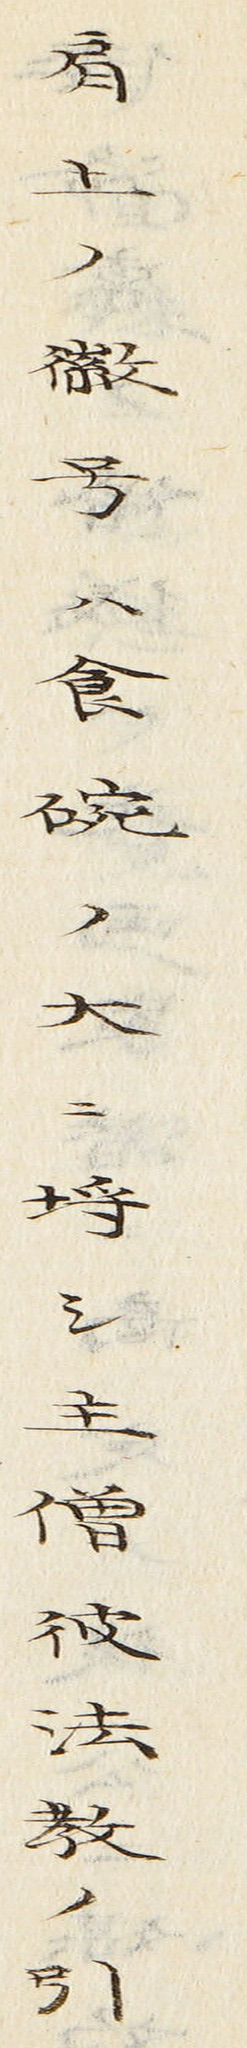肩上ノ徽号ハ食碗ノ大ニ埒シ主僧彼法教ノ引
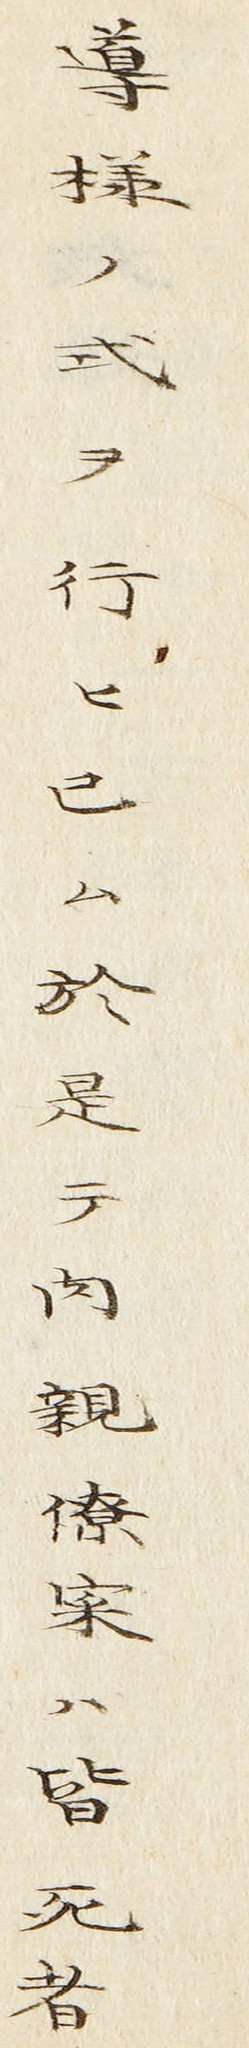導様ノ式ヲ行ヒ已ム於是テ肉親僚宷ハ皆死者
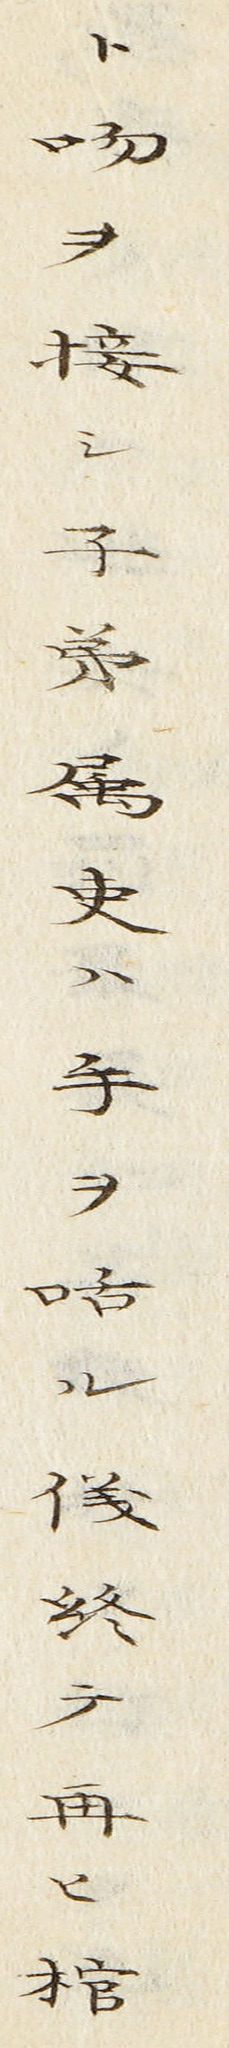ト吻ヲ接シ子弟属吏ハ手ヲ咶ル儀終テ再ヒ棺
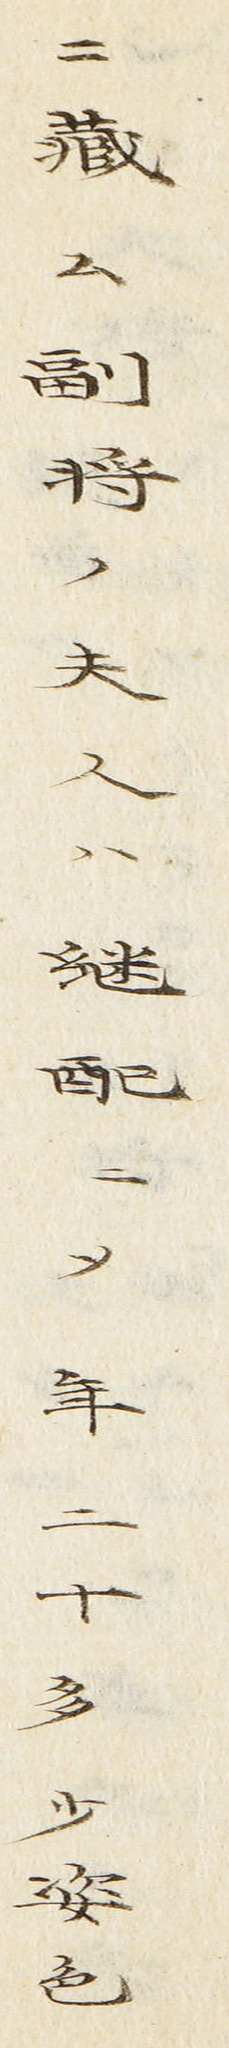ニ蔵ム副将ノ夫人ハ継配ニシテ年二十多少姿色
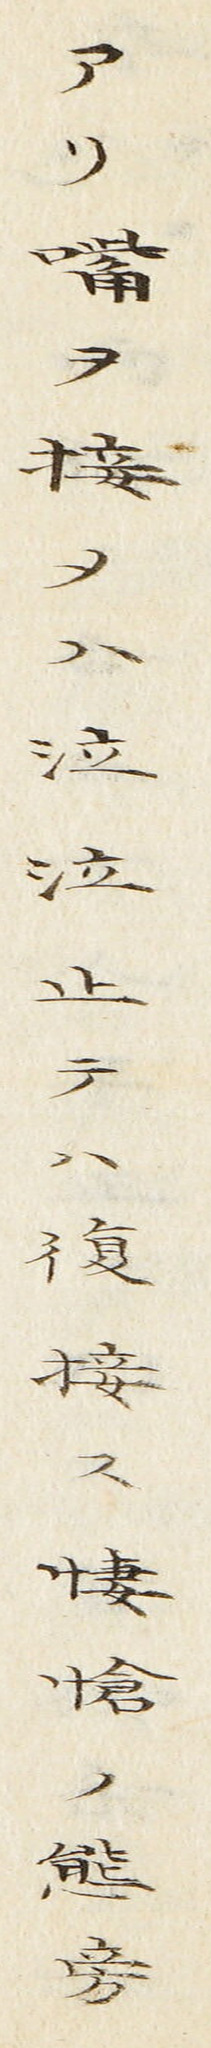アリ嘴ヲ接シテハ泣泣止テハ復接ス悽愴ノ態旁
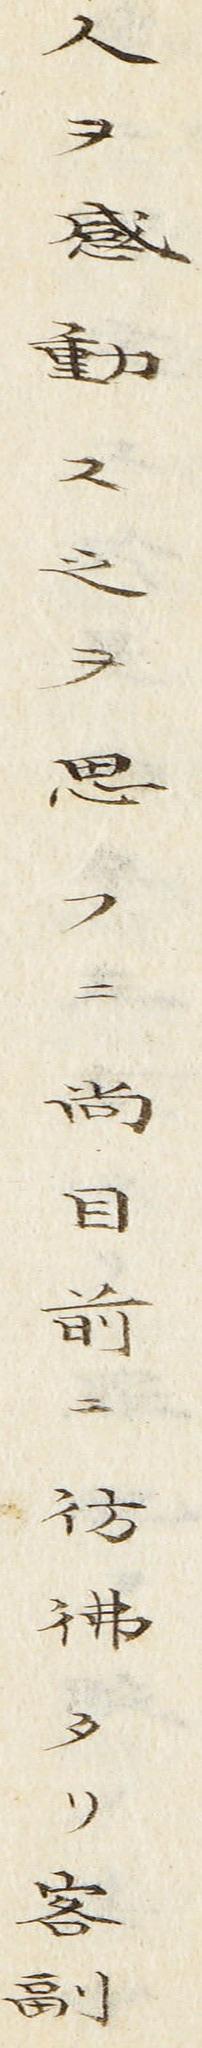人ヲ感動ス之ヲ思フニ尚目前ニ彷彿タリ客副
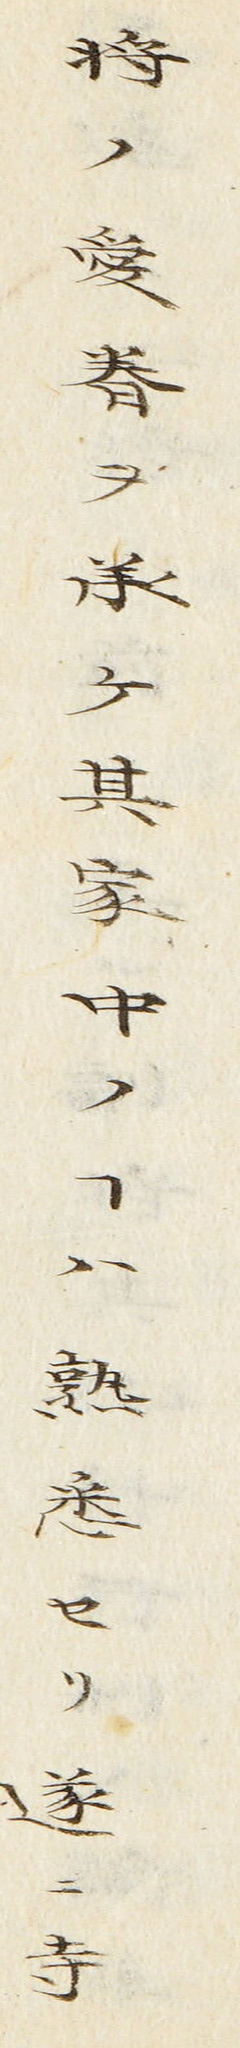将ノ愛眷ヲ承ケ其家中ノコトハ熟悉セリ遂ニ寺
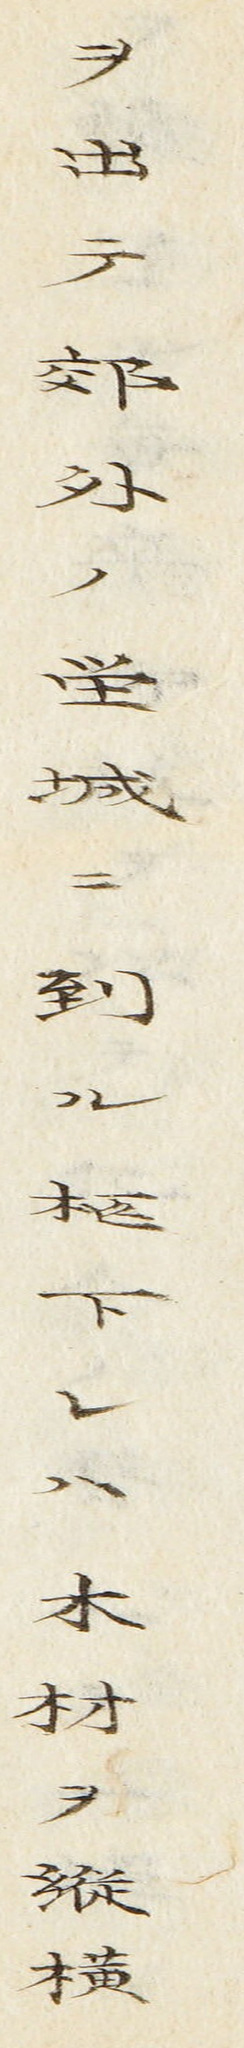ヲ出テ郊外ノ堂域ニ到ル柩下レハ木材ヲ縦横
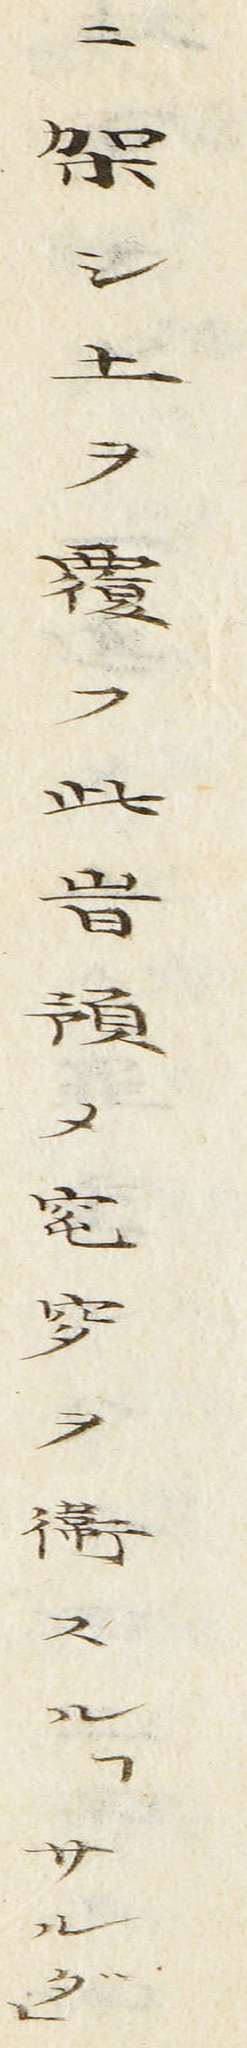ニ架シ土ヲ覆フ此時預メ窀穸ヲ衛スル「サルダ」
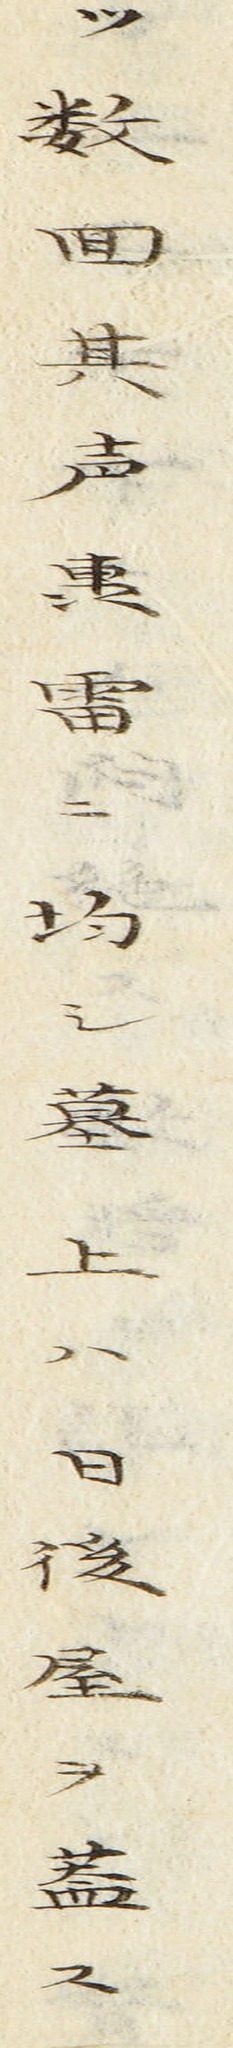ツ数回其声轟雷ニ均シ墓上ハ日後屋ヲ蓋ス

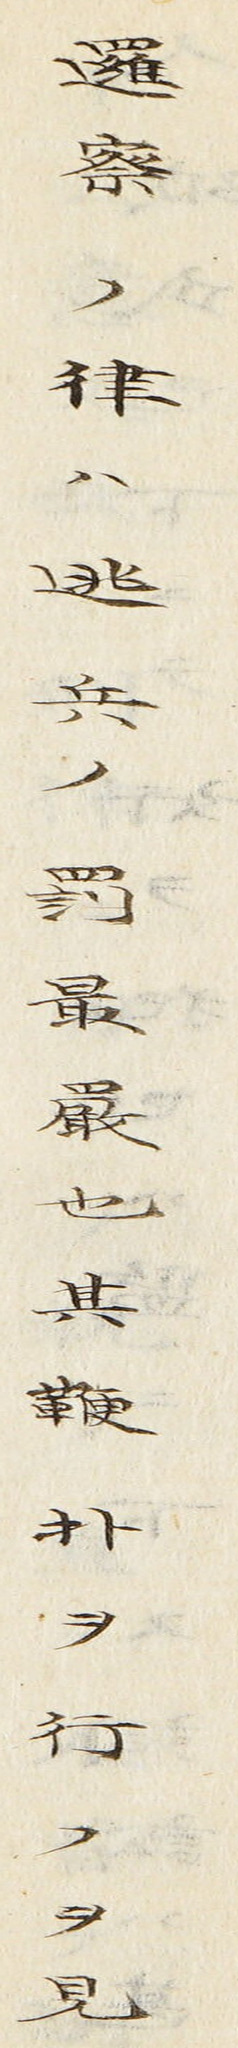〇邏察ノ律ハ逃兵ノ罰最厳也其鞭朴ヲ行フヲ見
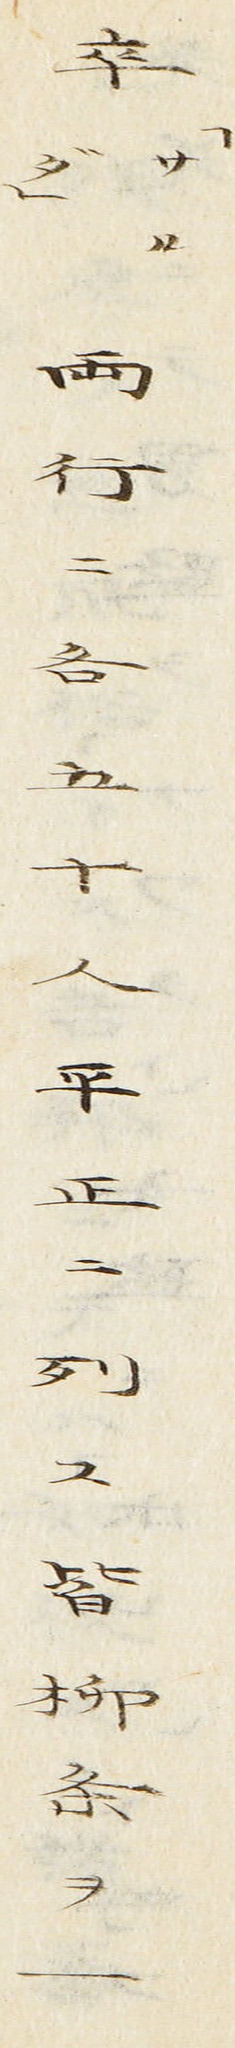卒「サルダ」両行ニ各五十人平正ニ列ス皆柳条ヲ一
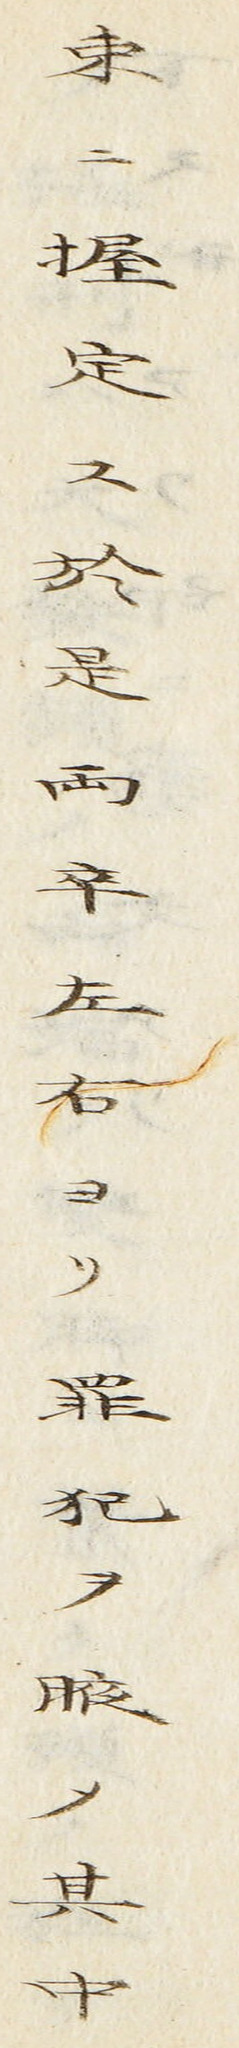束ニ握定ス於是両卒左右ヨリ罪犯ヲ腋シテ其中
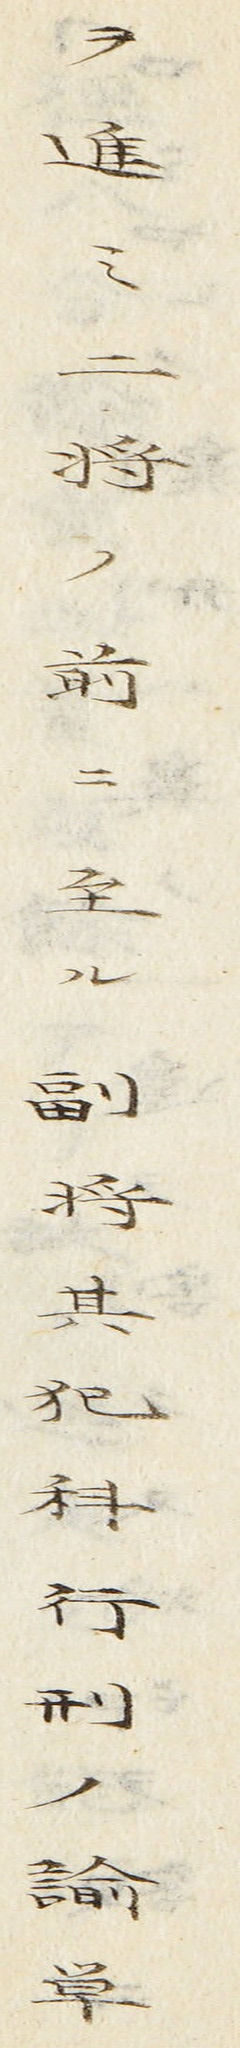ヲ進ミ二将ノ前ニ至ル副将其犯科行刑ノ諭単
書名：蕃談
